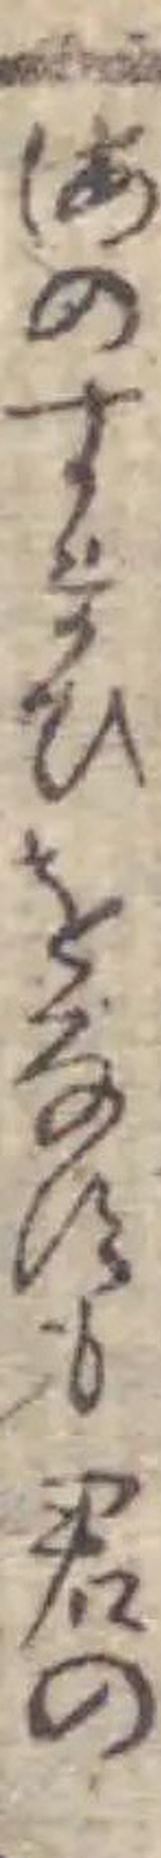海のすまひをなすも君の
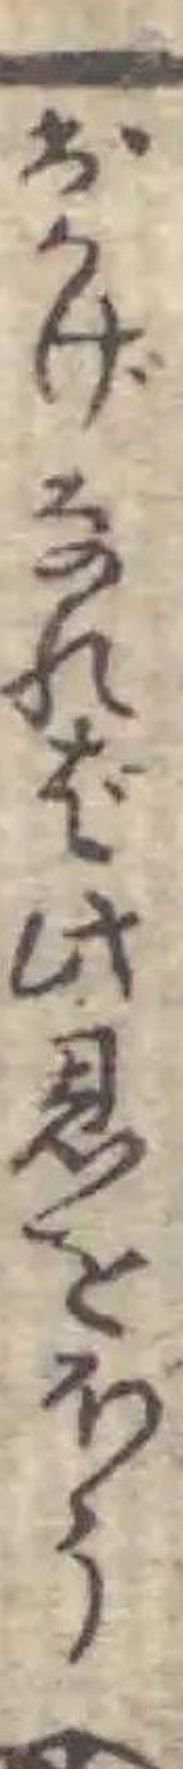おかげなれば此恩をほう
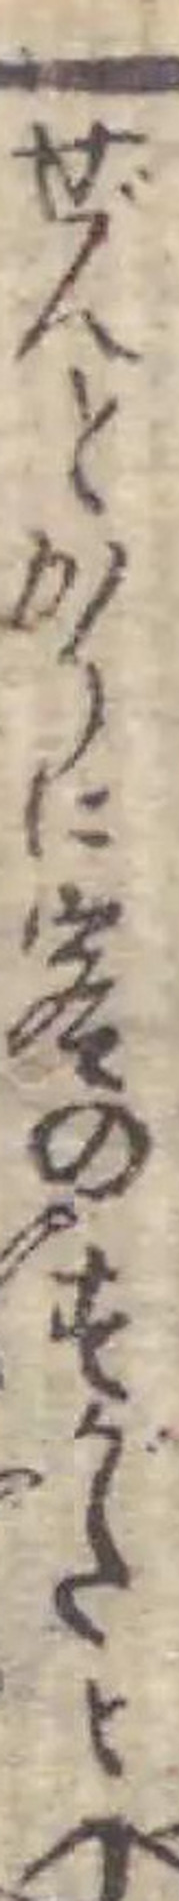ぜんとかりに客のすかたと
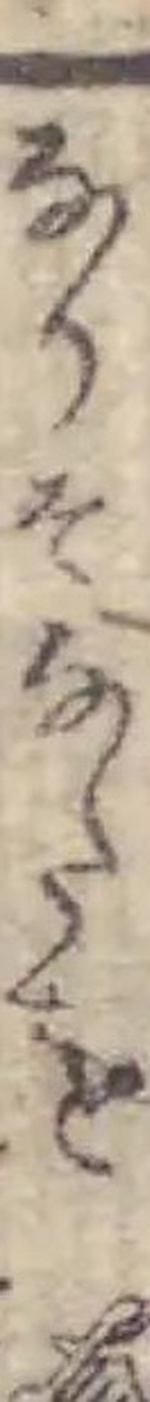なりそなたを
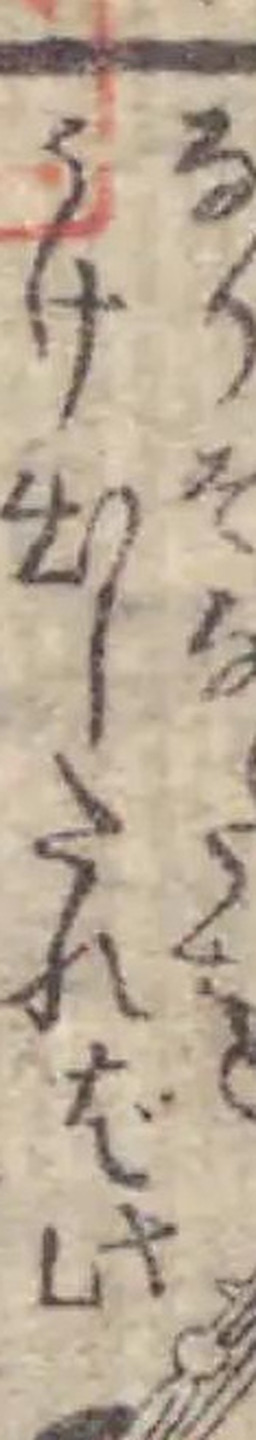うけ出したれば此
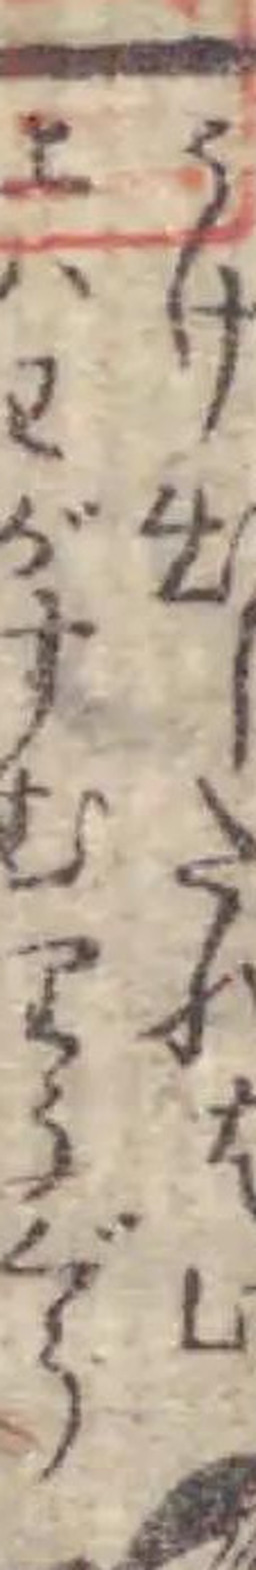上はわがすむりうぐう
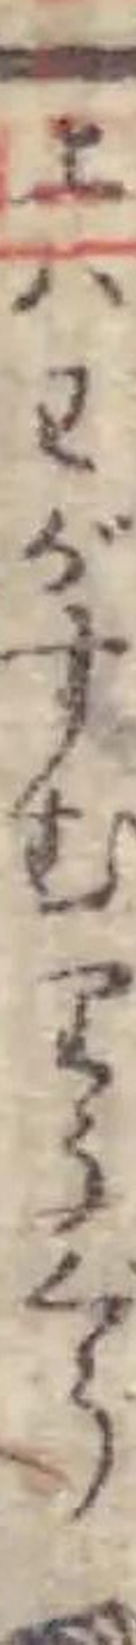上はわがすむりうぐう
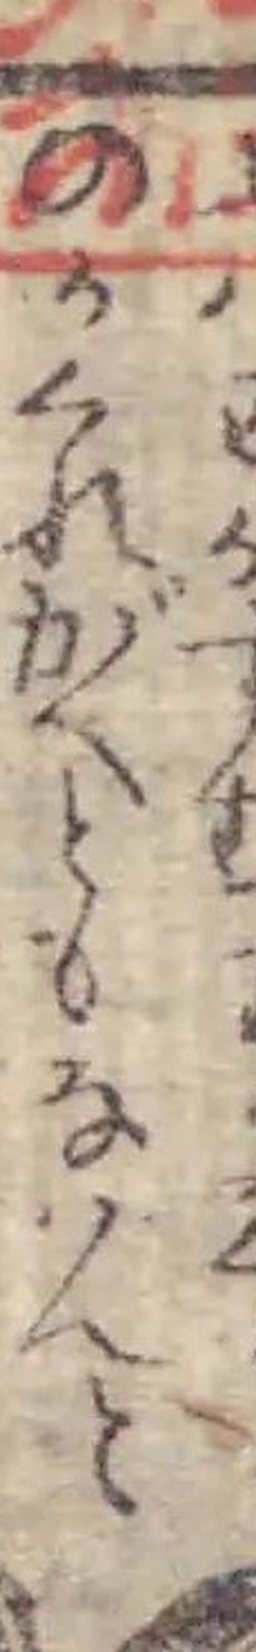のかくれがへともなはんと
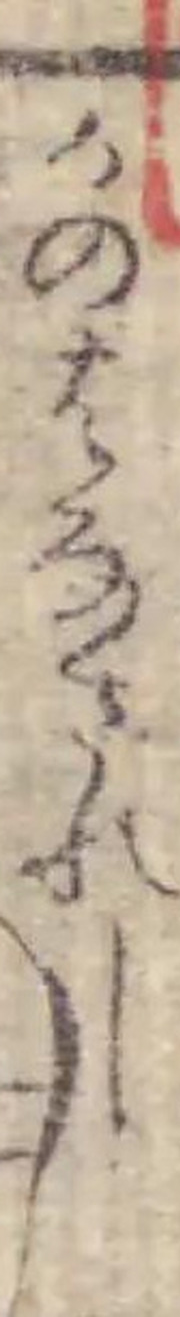かのはなされし
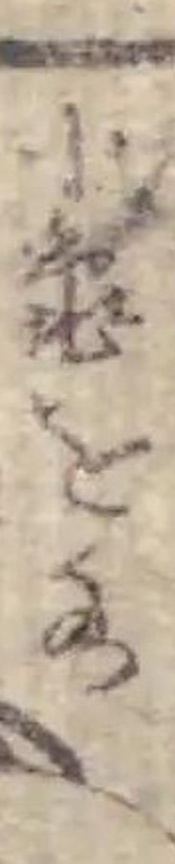小亀を水
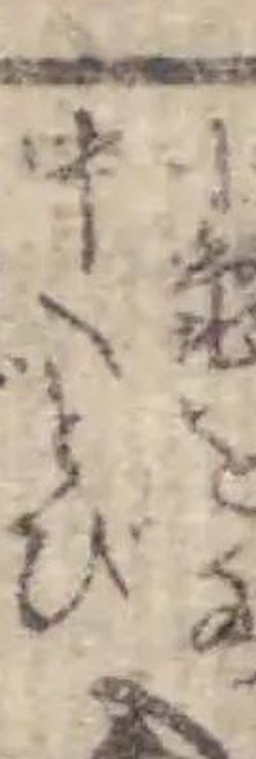中へとび
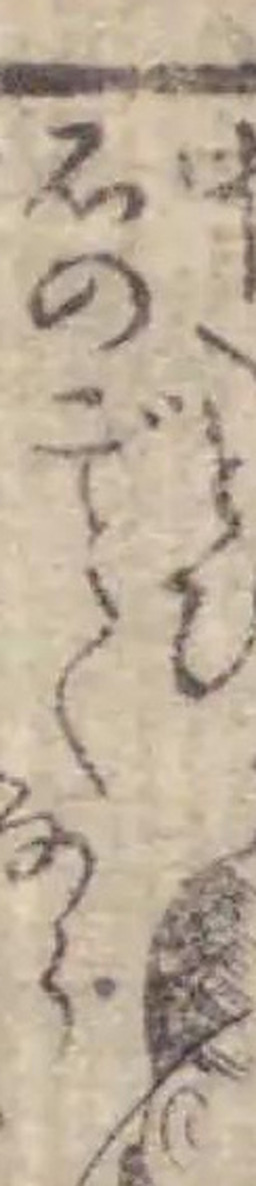石のごとくなら
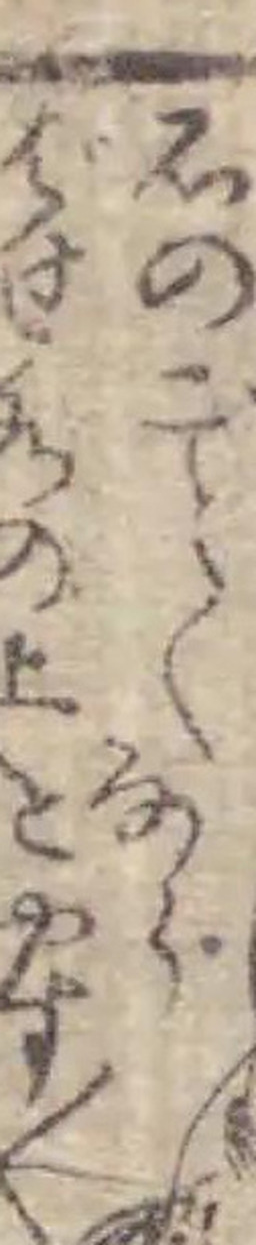ばせ水の上をやす〳〵
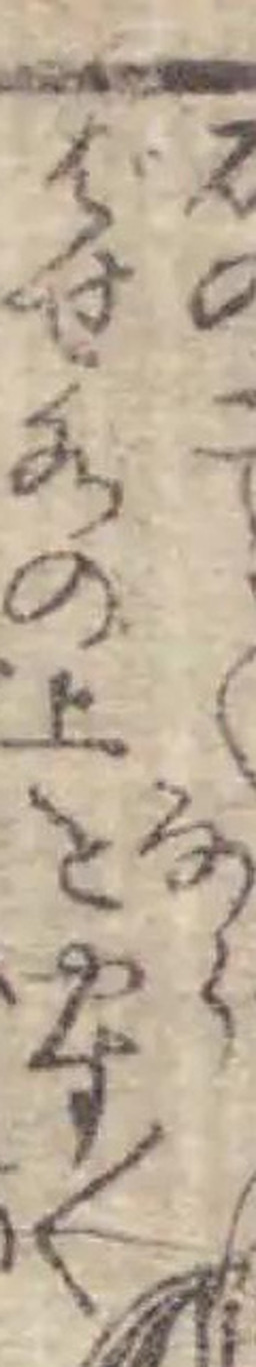ばせ水の上をやす〳〵
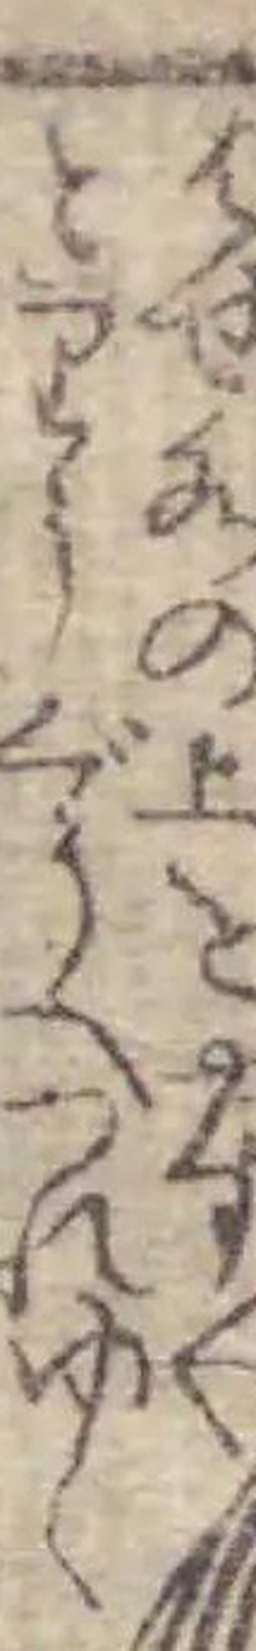とりうぐうへつれゆく
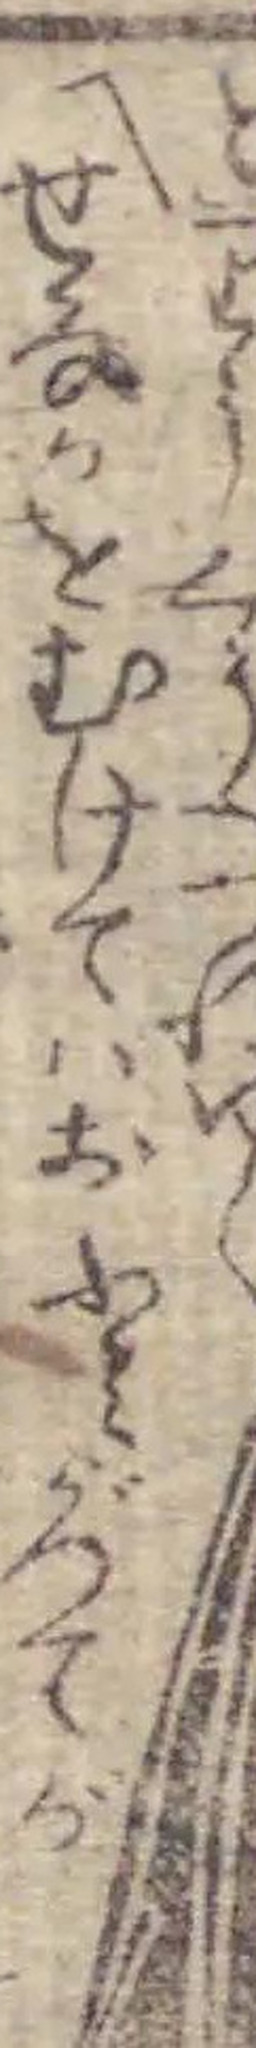〽せなかをむけてはおふみがつてが
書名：見立蓬莱 : 2巻
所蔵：国立国会図書館 National Diet Library, JAPAN
